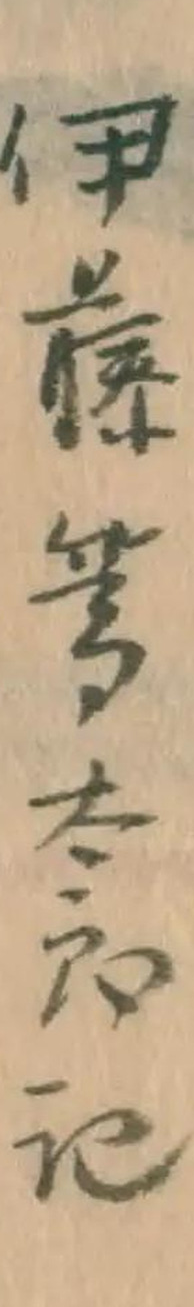伊藤篤太郎記
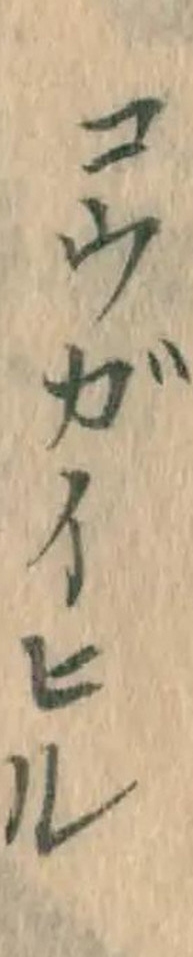カウガイビル(),

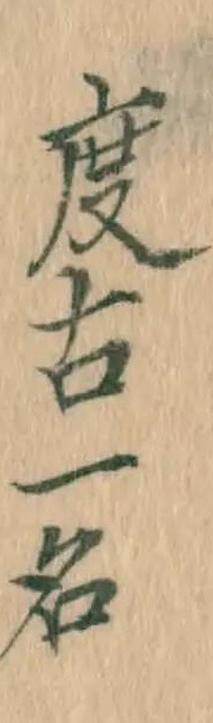度古一名
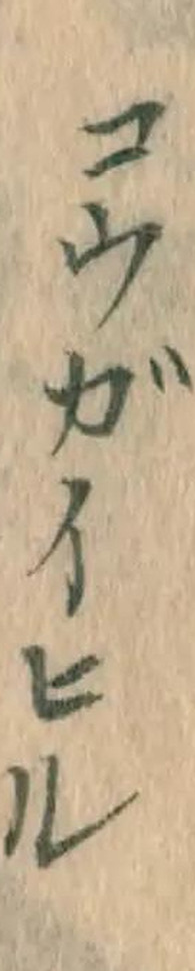コウガイヒル
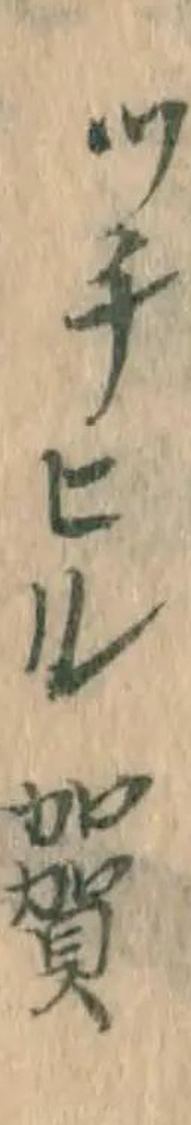ツチヒル加賀
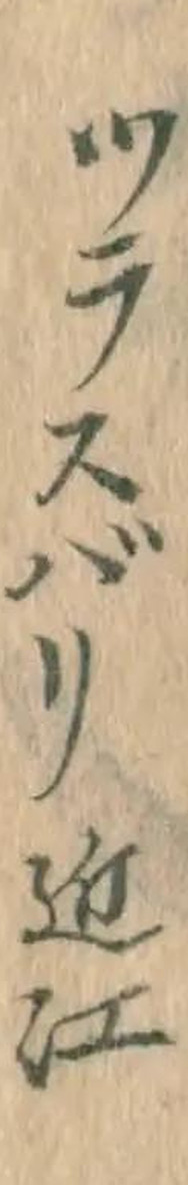ツラスバリ近江
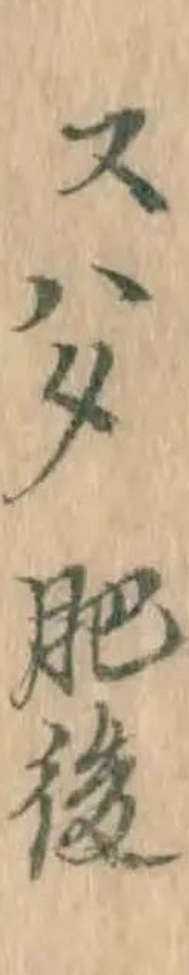スハタ肥後

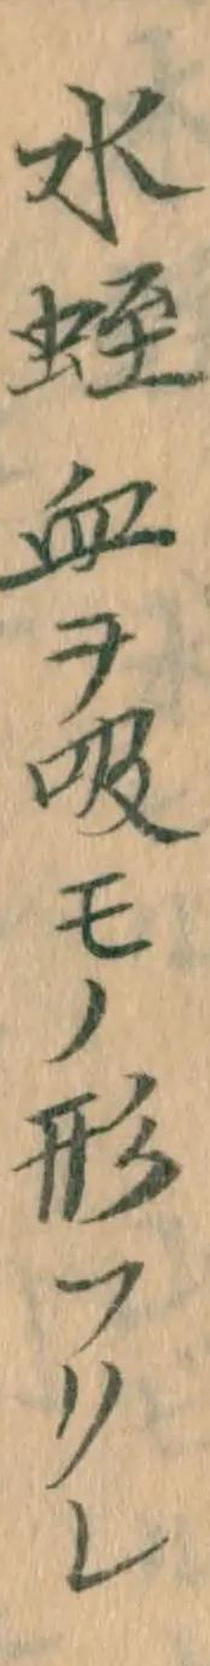水蛭血ヲ吸モノ形フクレ
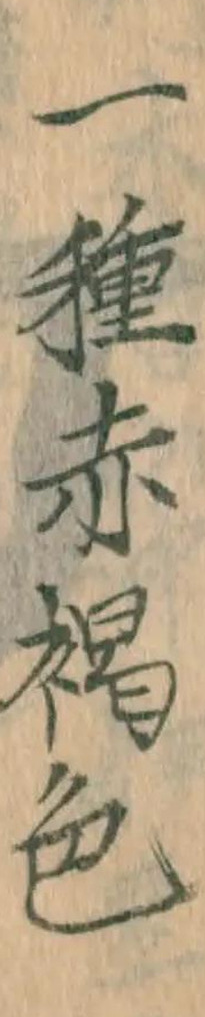一種赤褐色
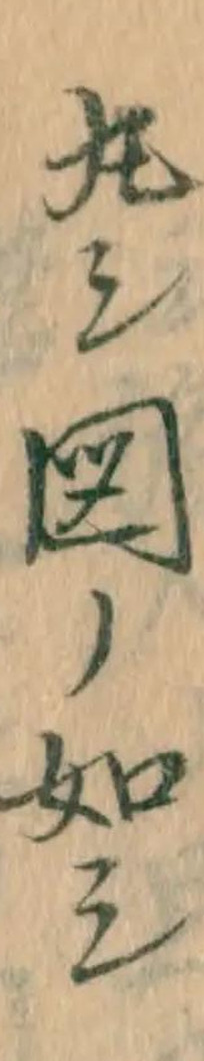丸シ図ノ如シ
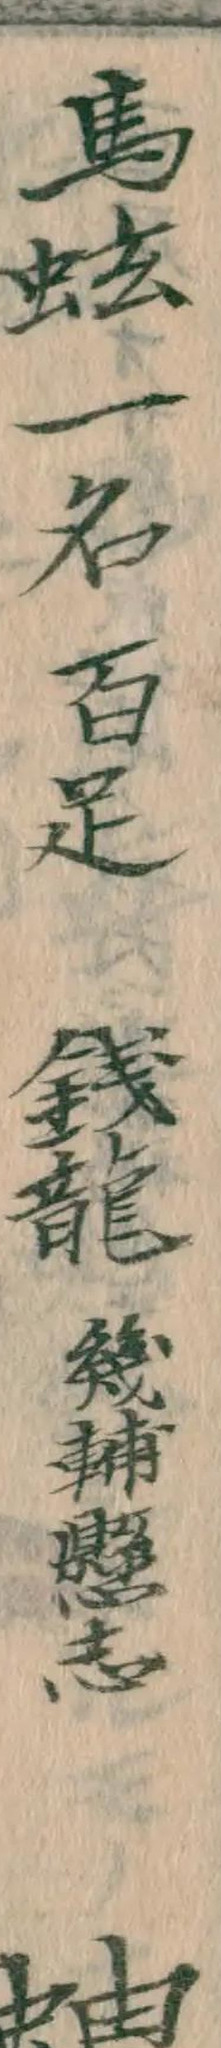馬蚿一名百足銭龍幾輔懸志
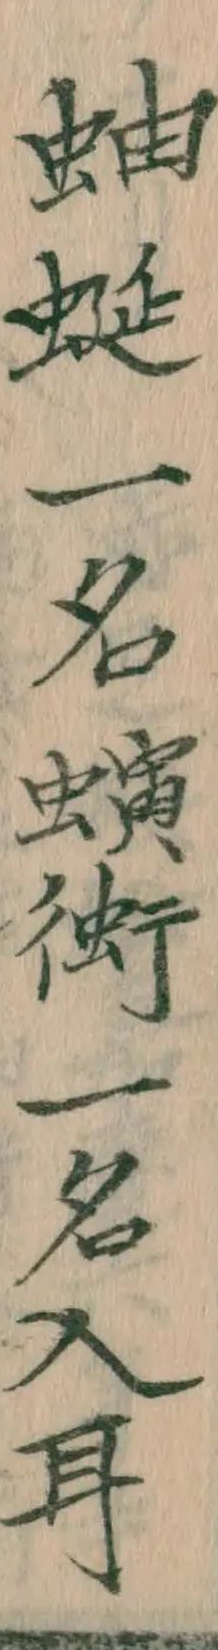蚰蜒一名螾一名入耳
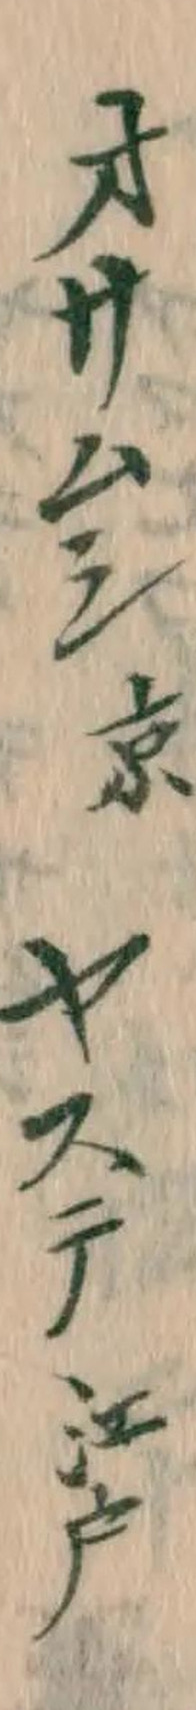オサムシ京ヤステ江戸
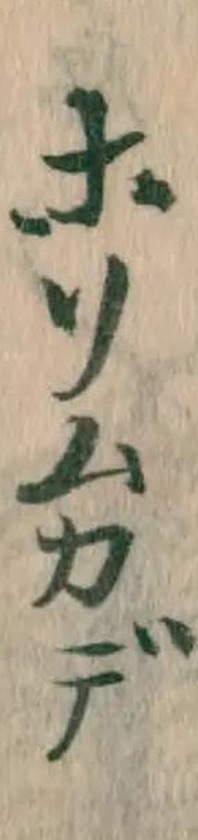ホリムカデ
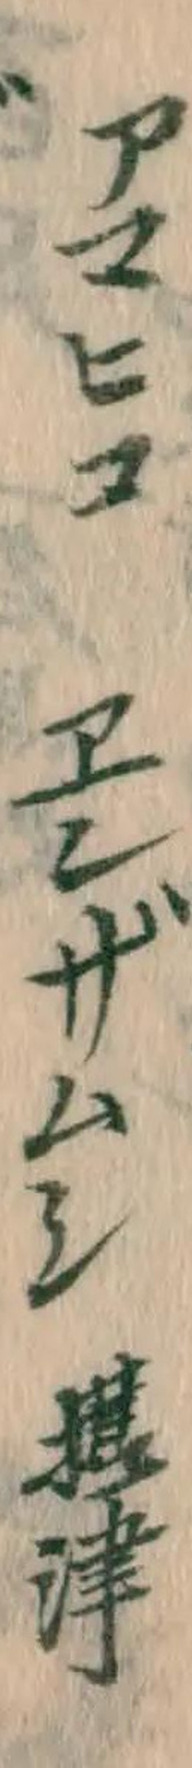アマヒコヱンザムシ摂津
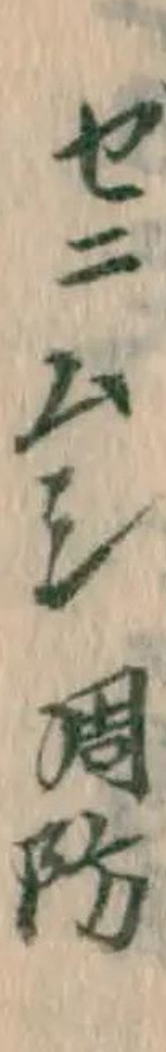ゼニムシ周防
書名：千蟲譜 3巻. [1]
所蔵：国立国会図書館 National Diet Library, JAPAN
